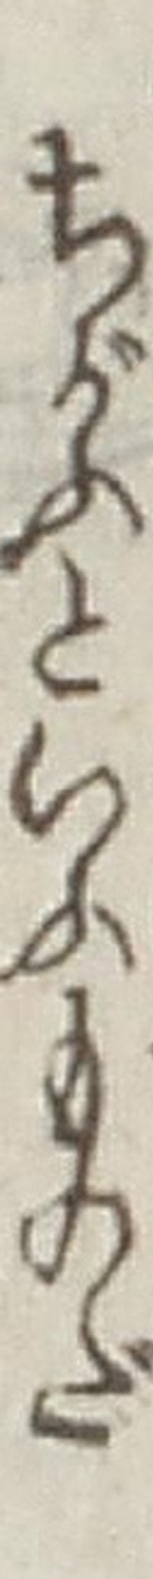ちがふといふものだ
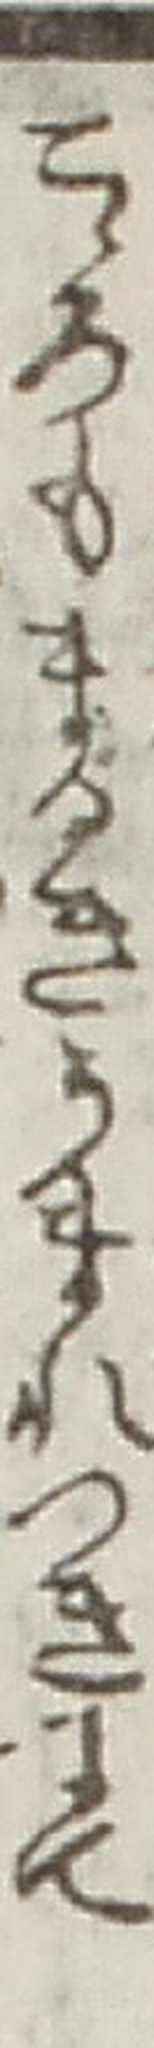こゝろもまるきうまれつきにて
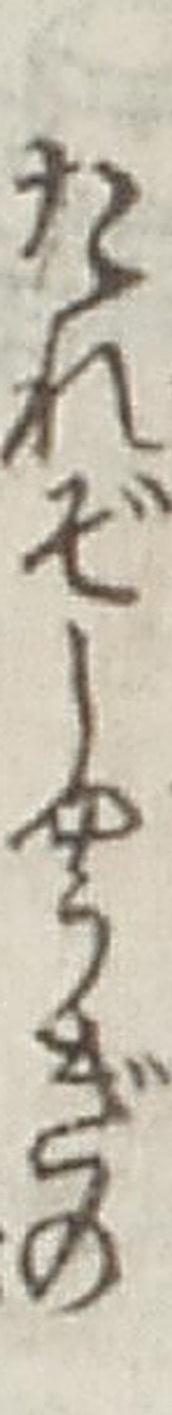たれぞしやうぎの
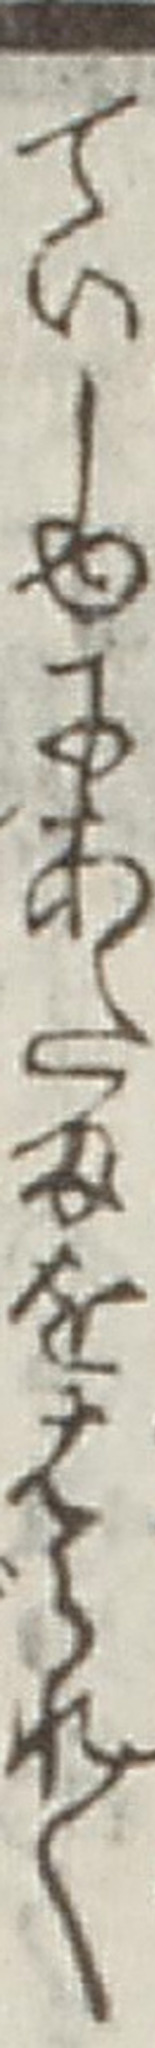ていしゆにあたまをはられ〳〵
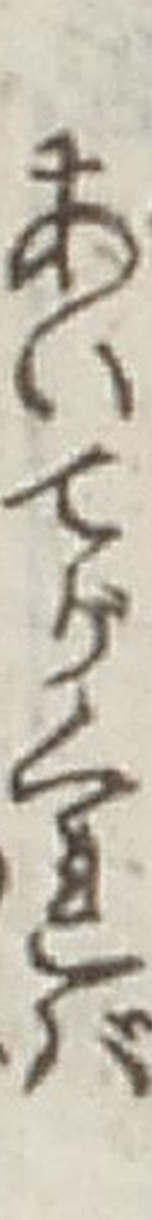あいてが？くれば
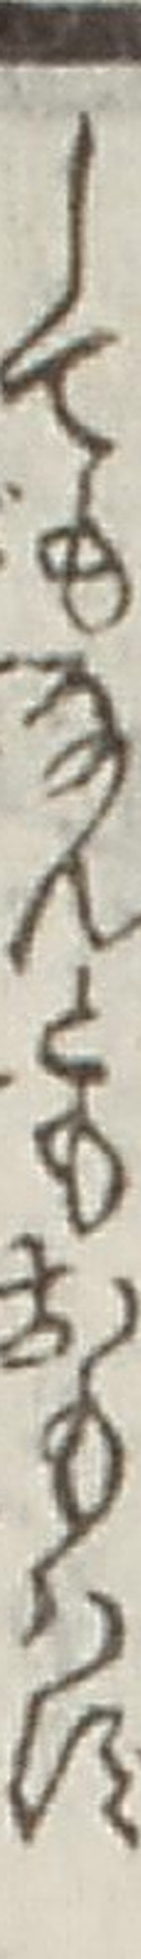してもなんともおもはず
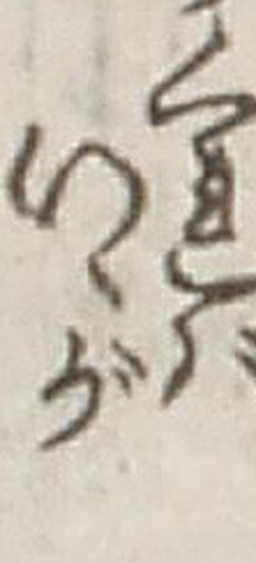いゝが
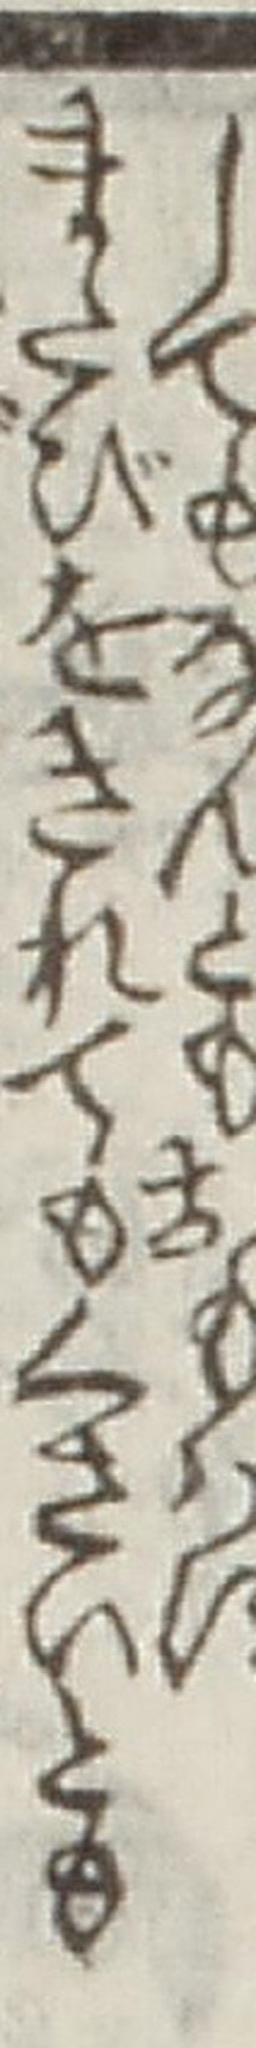またびをきれてもくさいとも
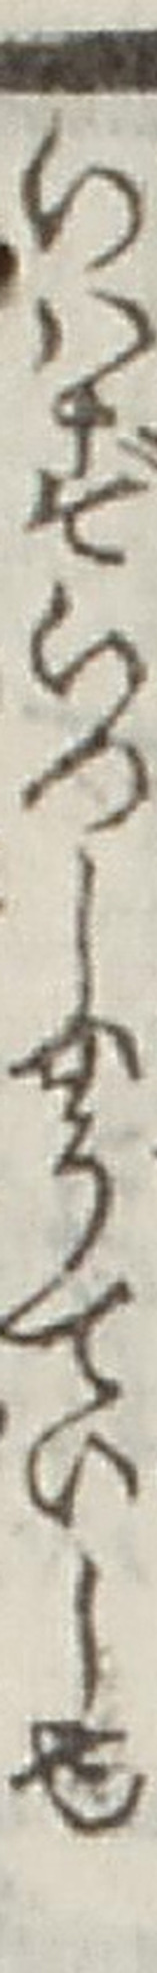いはずいつしやうていしゆ
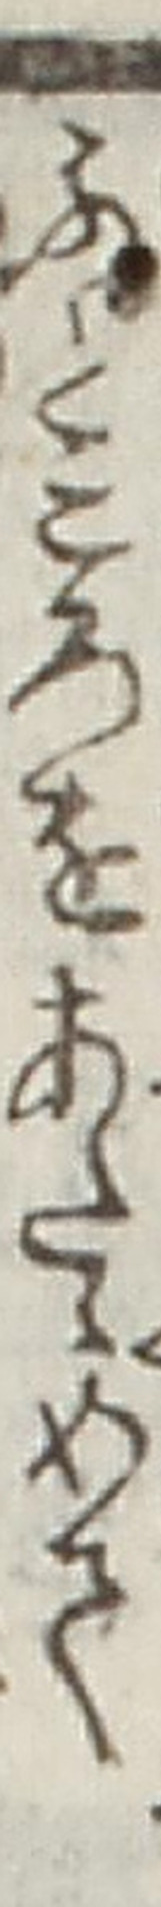ふところをあたゝめて
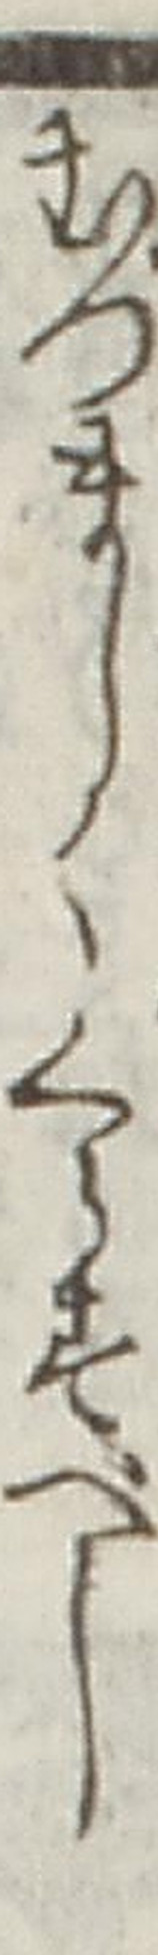むつましくくらすべし
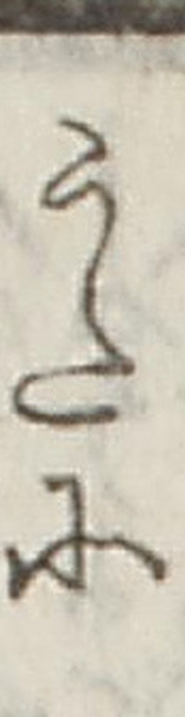うたに
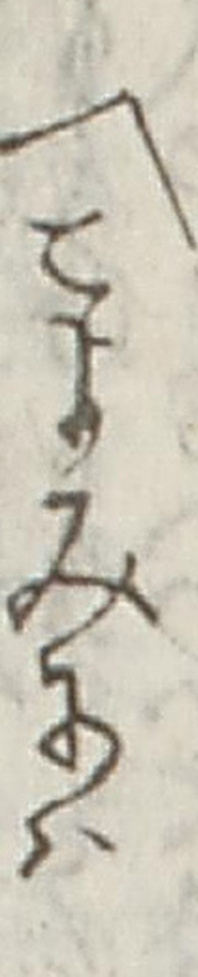〽こよみには
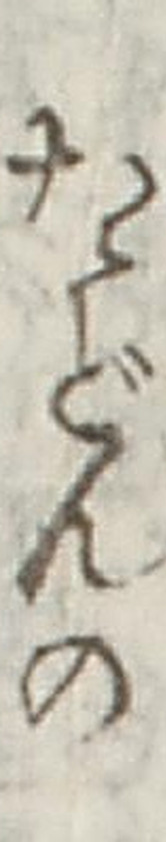たどんの
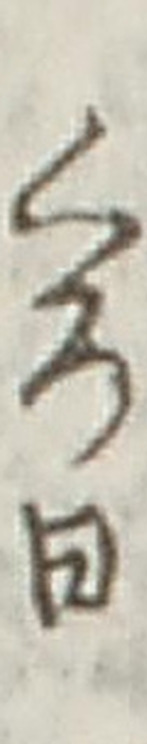くろ日
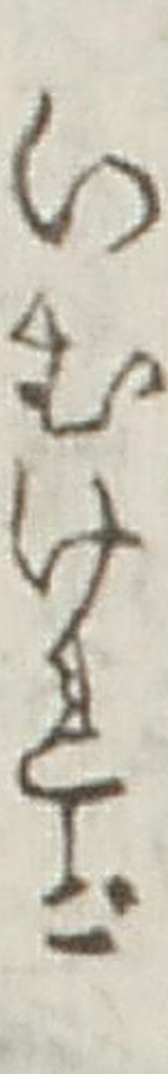いむけれど
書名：三世相出雲當座帳　上下冊
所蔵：東京大学地震研究所図書室 Earthquake Research Institute Library, The University of Tokyo, JAPAN
